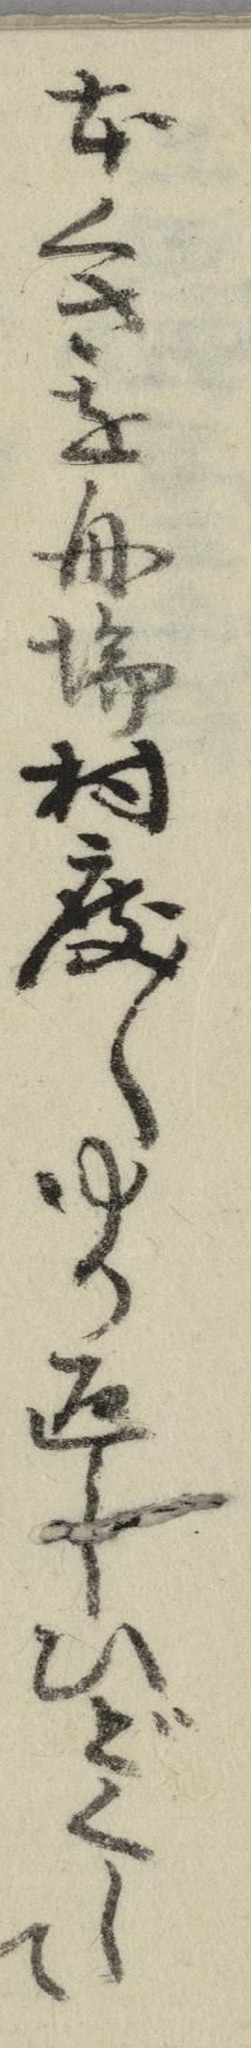本くさを舟場村度〳〵ゆり返しひどくして
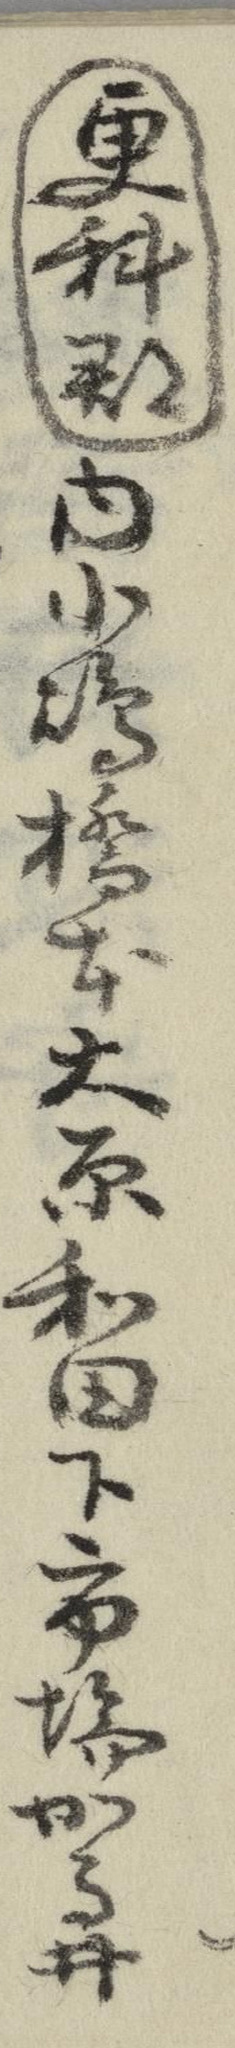更科郡内小嶋橋本大原和田下市場かる井
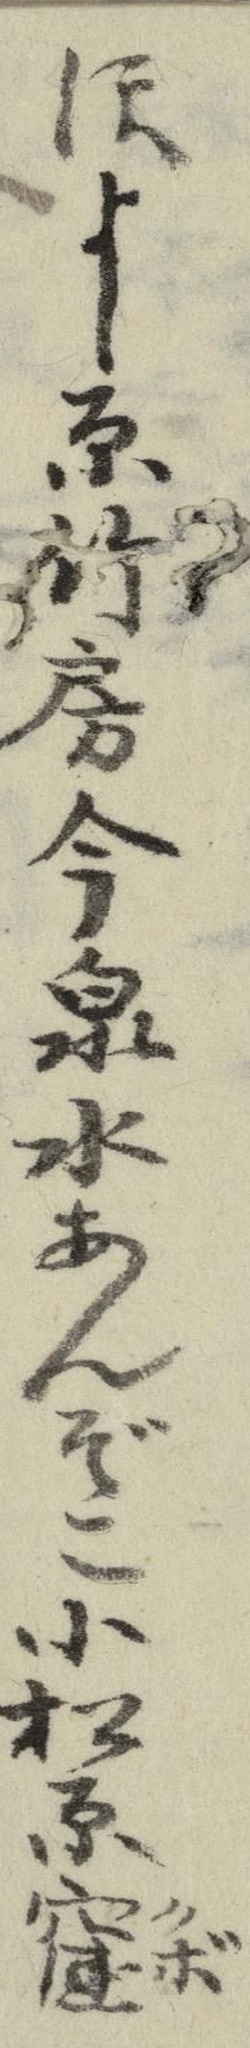沢よし原竹房今泉水あんぞこ小松原窪
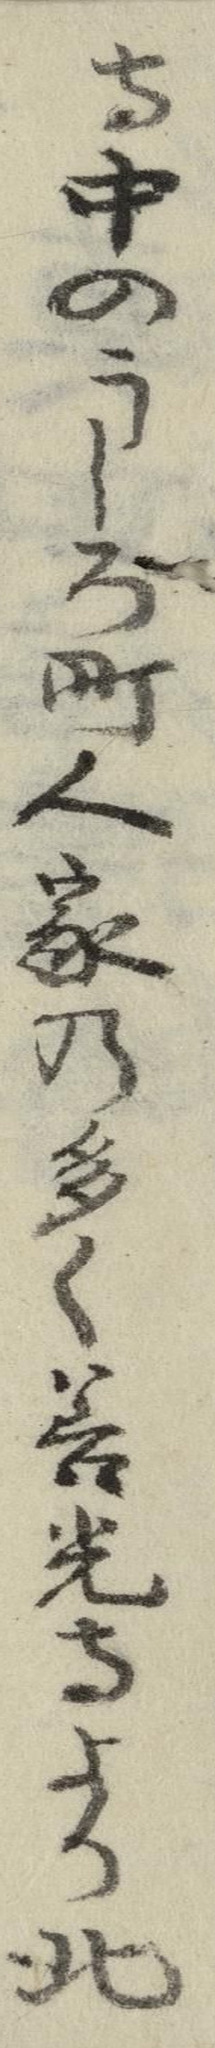寺中のうしろ町人家の多く善光寺より北
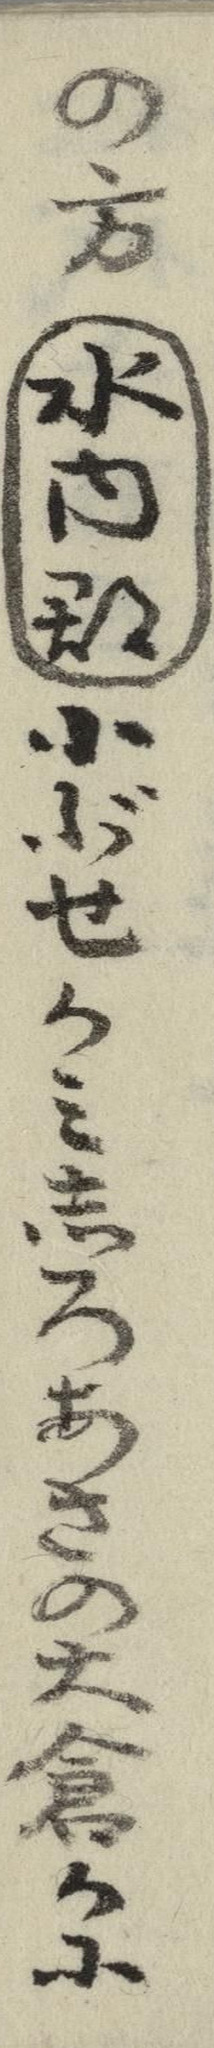の方水内郡小ぶせかみしろあさの大倉かに

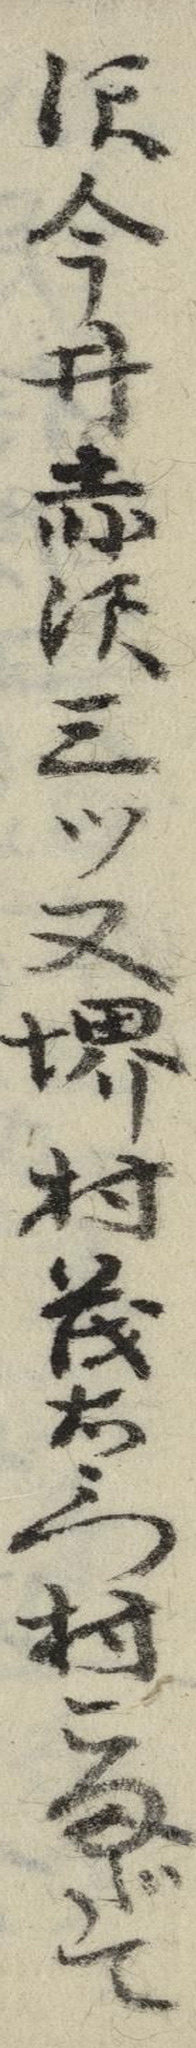沢今井赤沢三ツ又堺村茂右衛門村こまだて
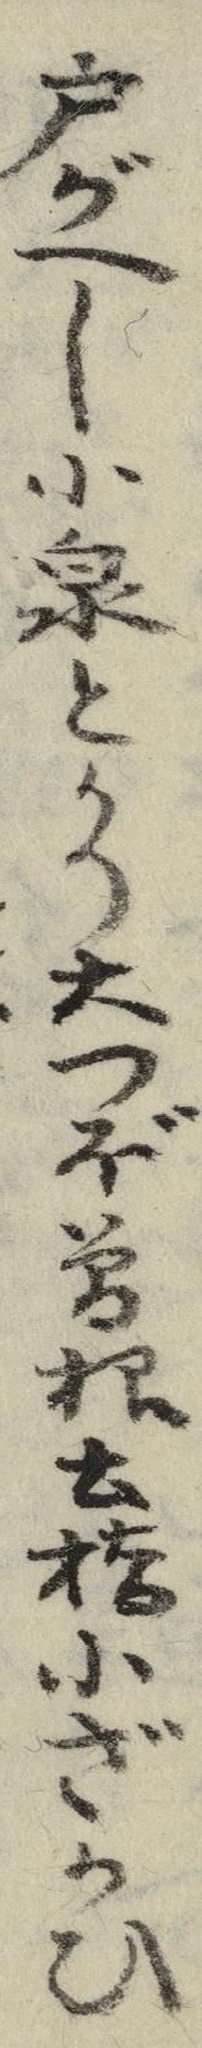戸がへし小泉とかり大つぼ曽根土橋小ざかひ
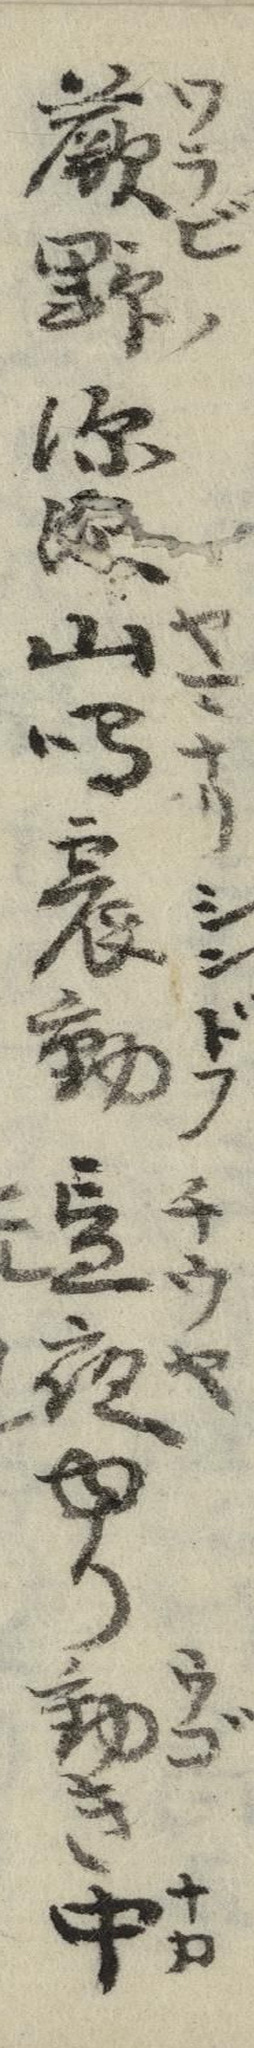蕨野深沢山鳴震動昼夜ゆり動き中
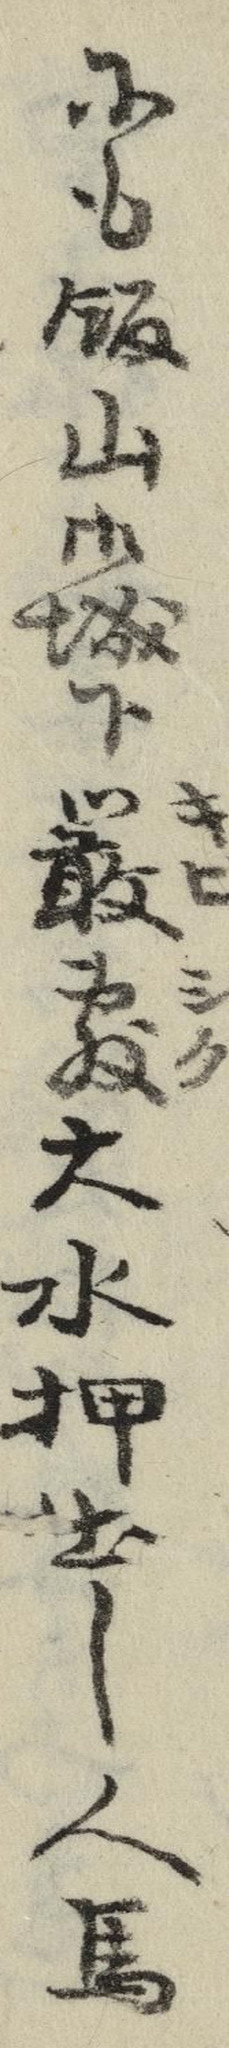にも飯山御城下厳敷大水押出し人馬
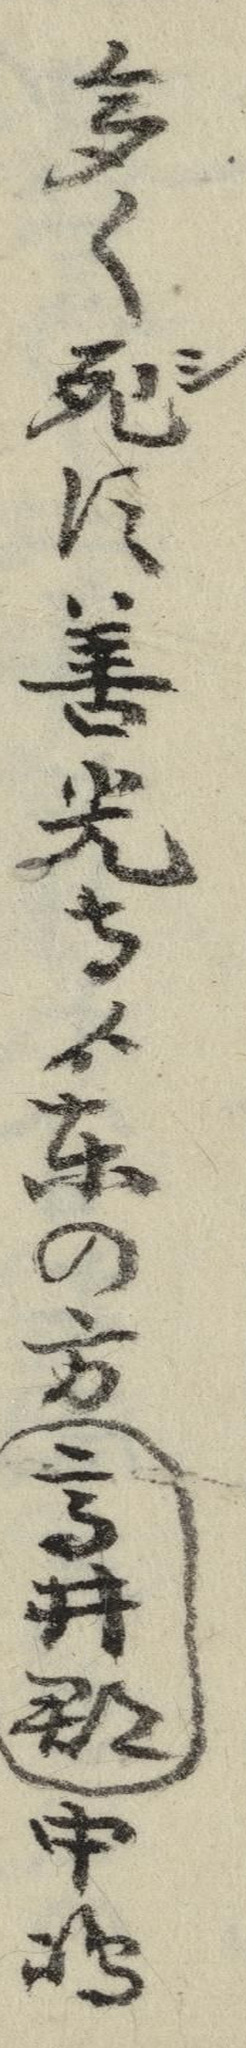多く死す善光寺ゟ東の方高井郡中嶋
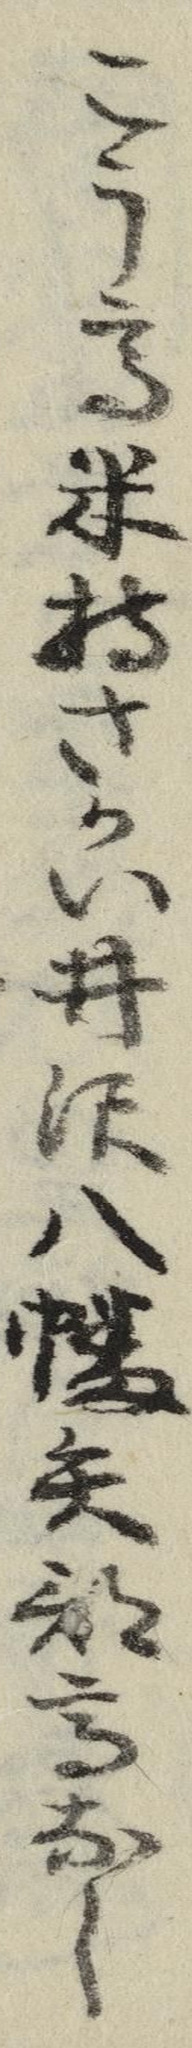こう高米持さかい井沢八幡矢部高なし
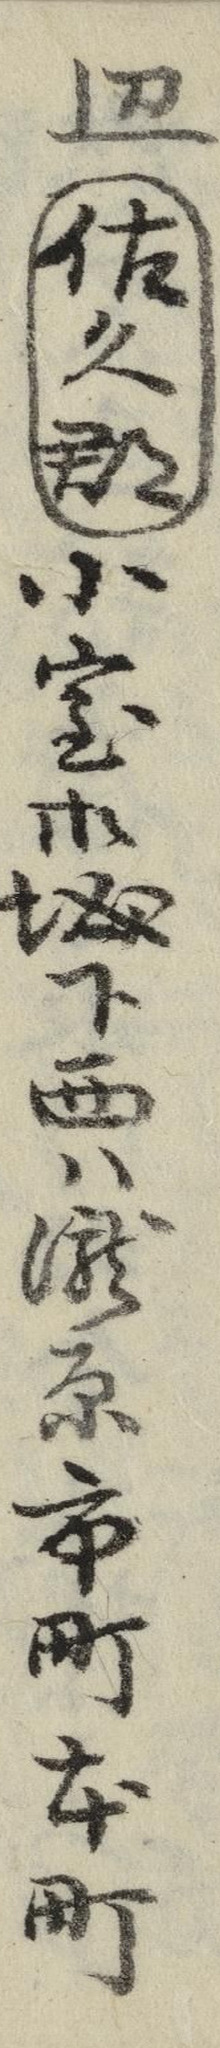辺佐久郡小室御城下西ハ瀧原市町本町
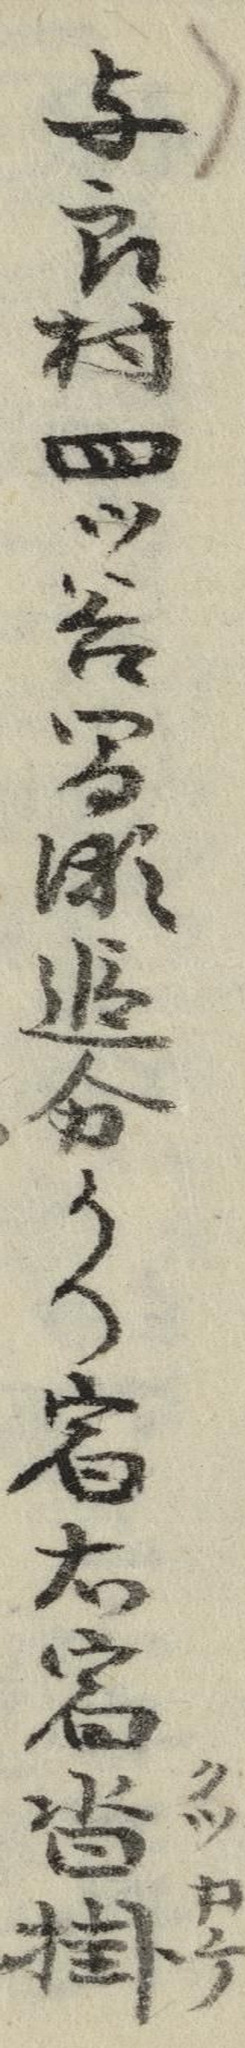与郎村四ツ谷間瀬追分かり宿右宿沓掛
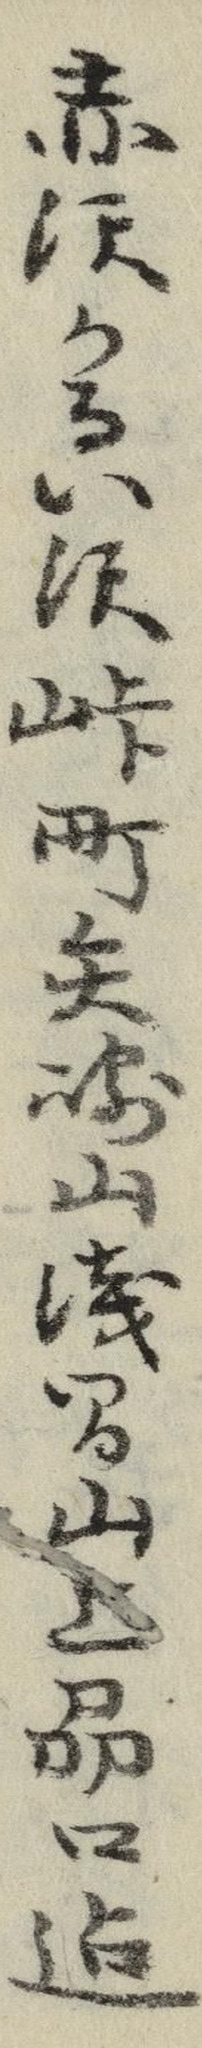赤沢かるい沢峠町矢崎山浅間山上州口迄
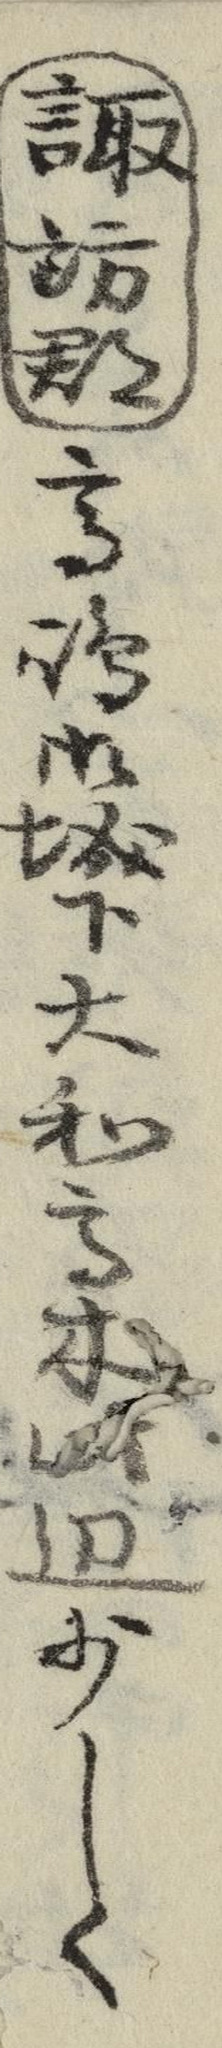諏訪郡高嶋御城下大和高木此辺少しく
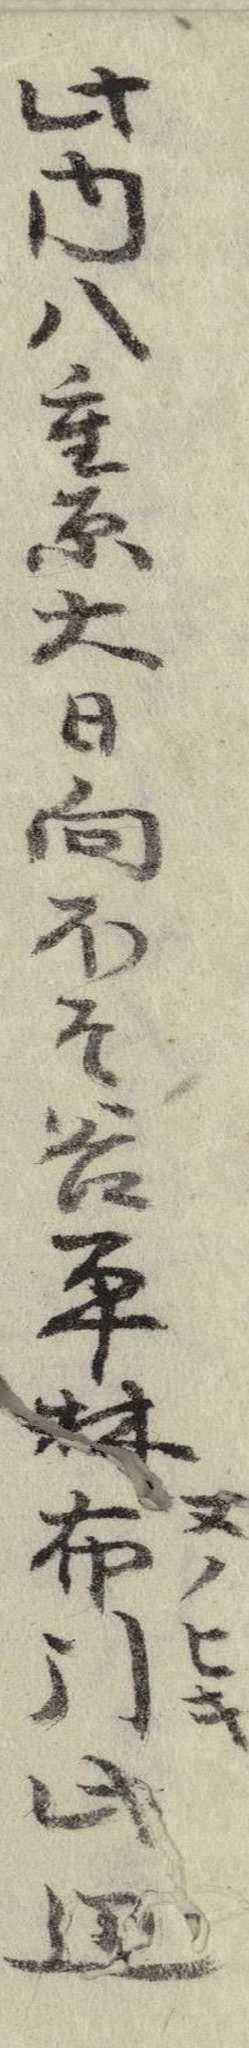此内八重原大日向ほそ谷平林布引此の辺
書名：信州大地震一件之冩　丁未弘化四年三月吉日
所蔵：東京大学地震研究所図書室 Earthquake Research Institute Library, The University of Tokyo, JAPAN
